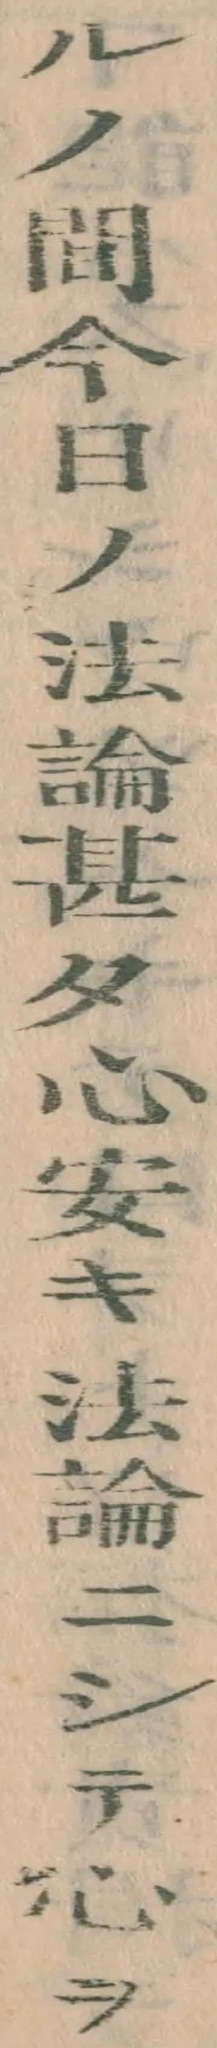ルノ間今日ノ法論甚タ心安キ法論ニシテ心ヲ
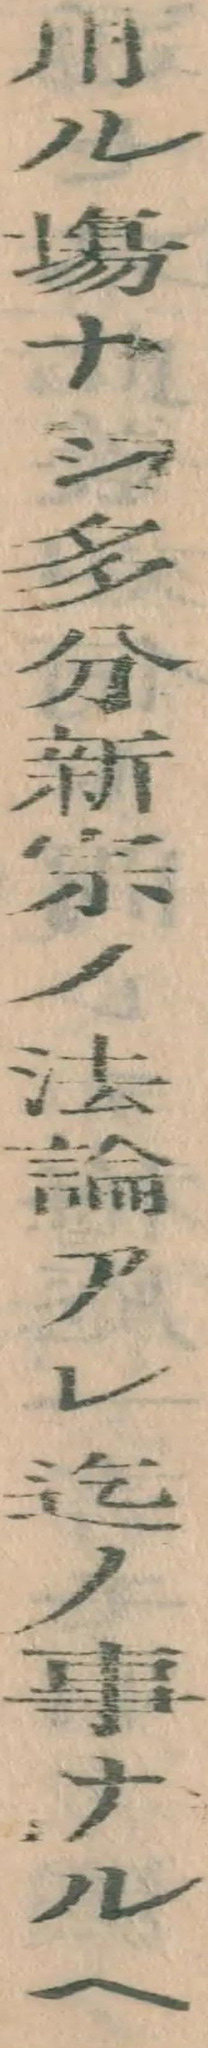用ル場ナシ多分新宗ノ法論アレ迄ノ事ナルヘ
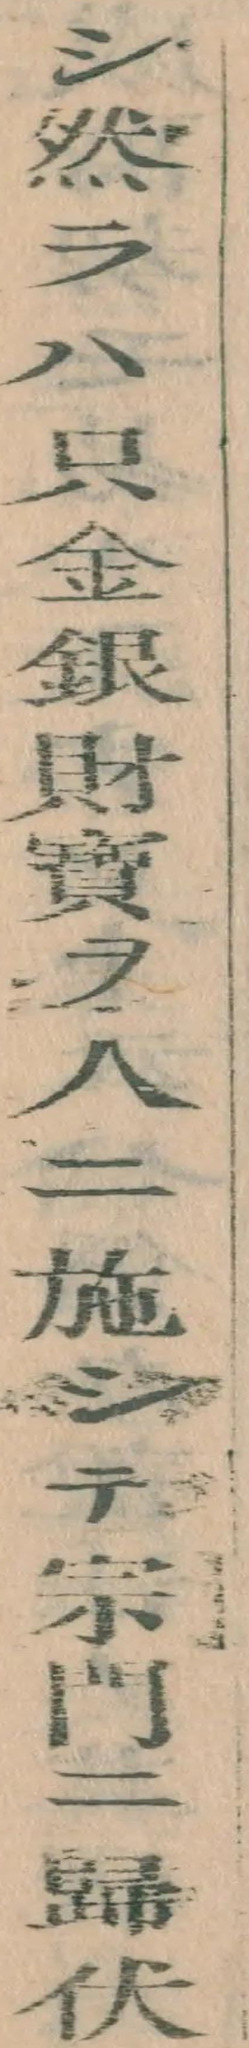シ然ラハ只金銀財宝ヲ人ニ施シテ宗門ニ帰伏
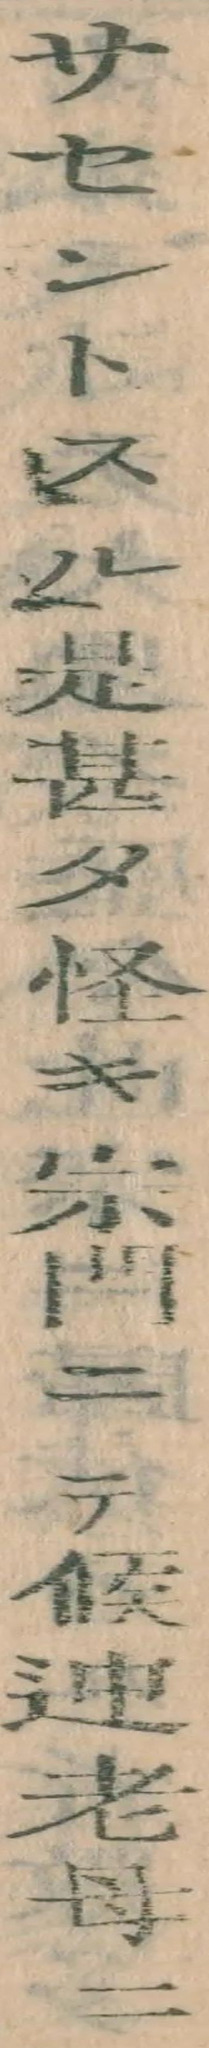サセントスル是甚タ怪キ宗門ニテ候迚老母ニ
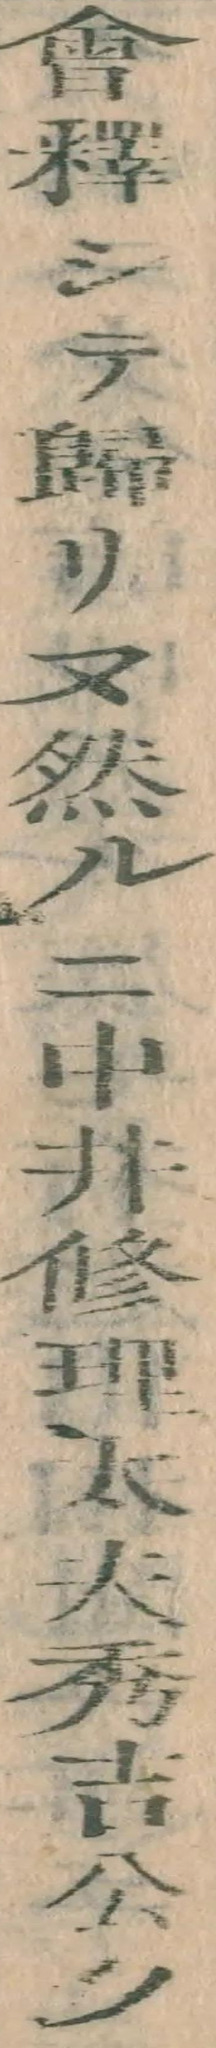会釈シテ帰リヌ然ルニ中井修理太夫秀吉公ノ
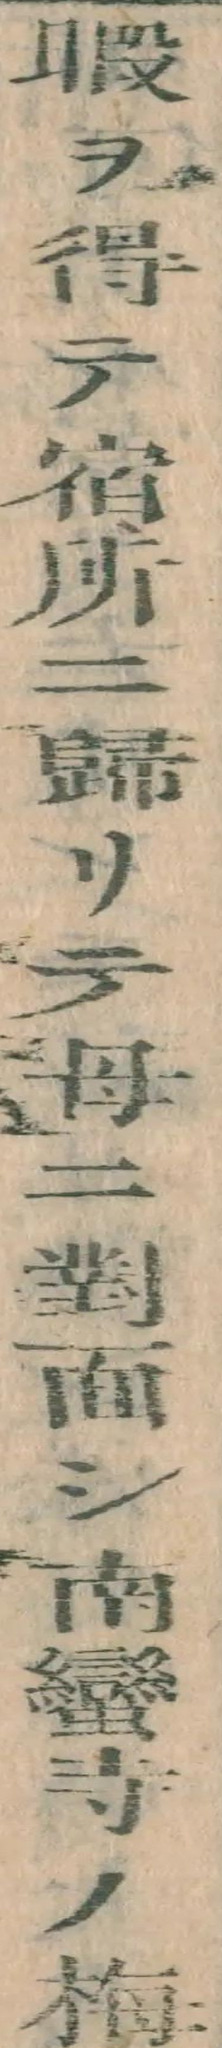暇ヲ得テ宿所ニ帰リテ母ニ対面シ南蛮寺ノ梅
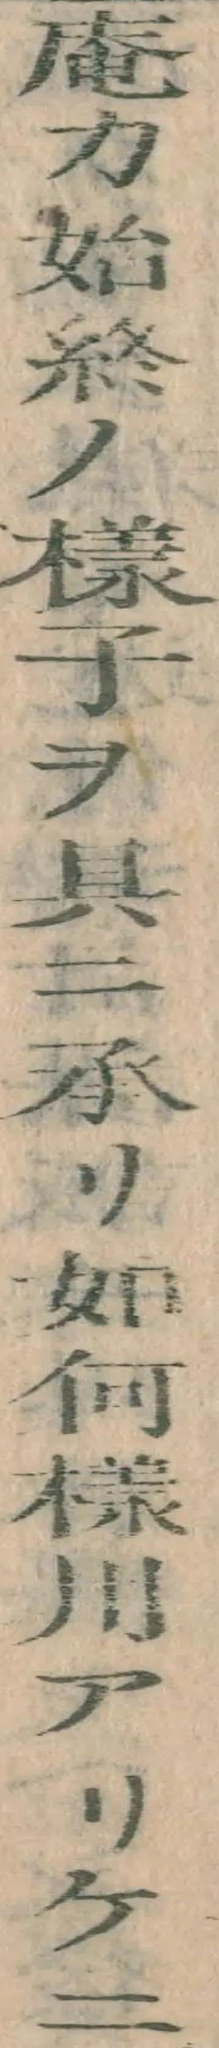庵カ始終ノ様子ヲ具ニ承リ如何様用アリケニ
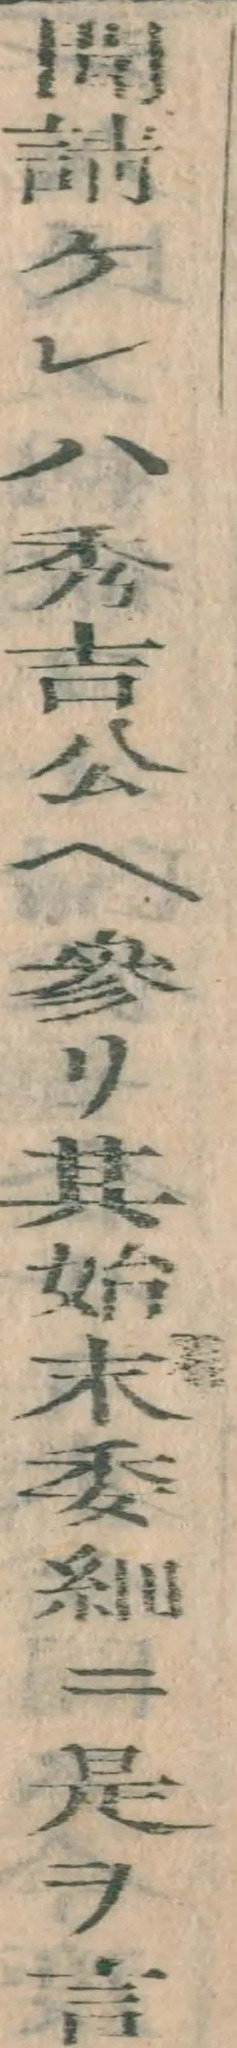聞請ケレハ秀吉公ヘ参リ其始末委細ニ是ヲ言
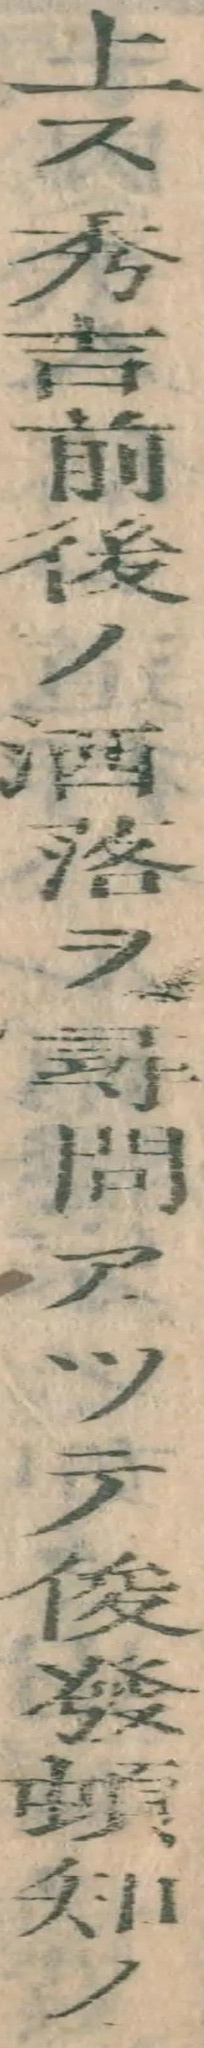上ス秀吉前後ノ洒落ヲ尋問アツテ俊発頓知ノ
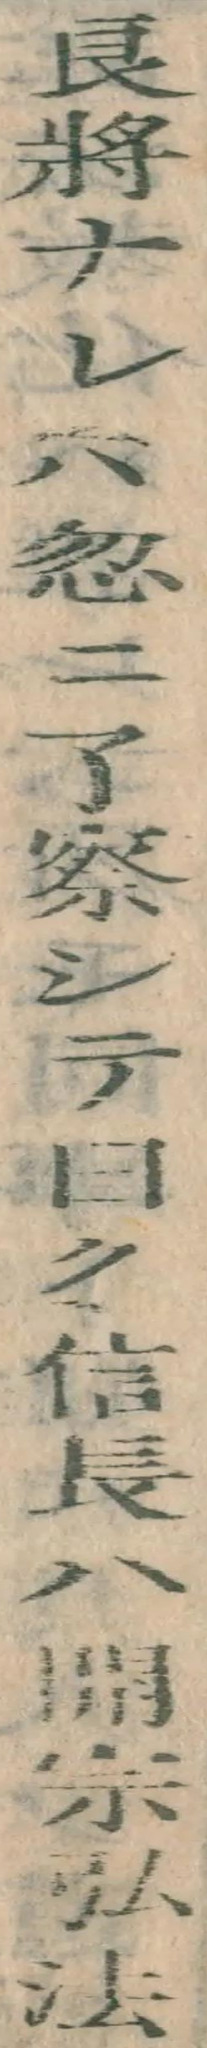良将ナレハ忽ニ了察シテ曰ク信長ハ開宗弘法
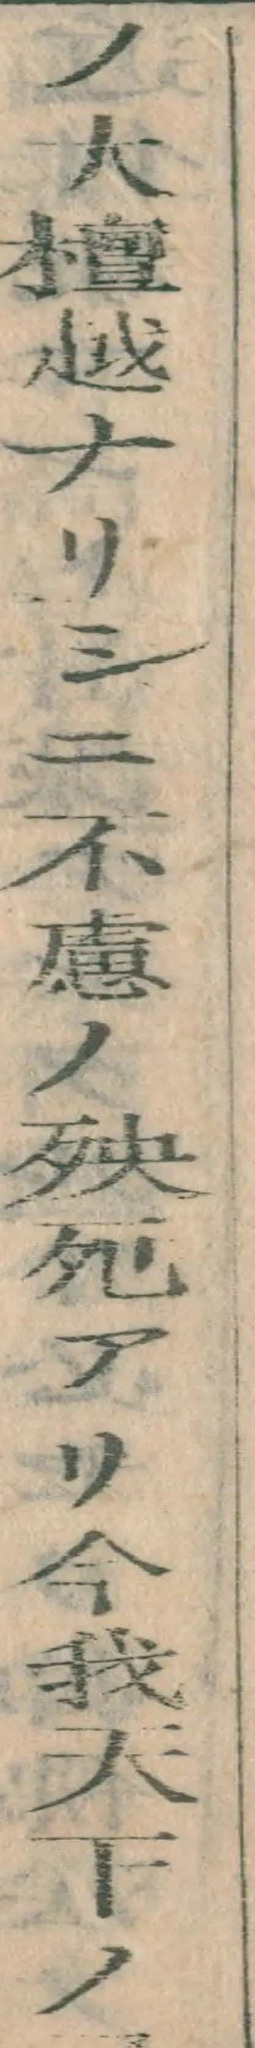ノ大檀越ナリシニ不慮ノ殃死アリ今我天下ノ
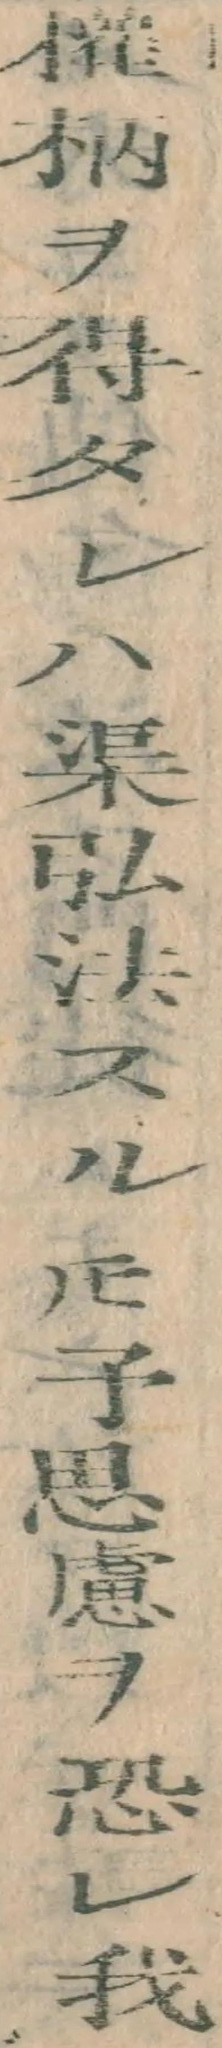権柄ヲ得タレハ渠弘法スルトモ予思慮ヲ恐レ我
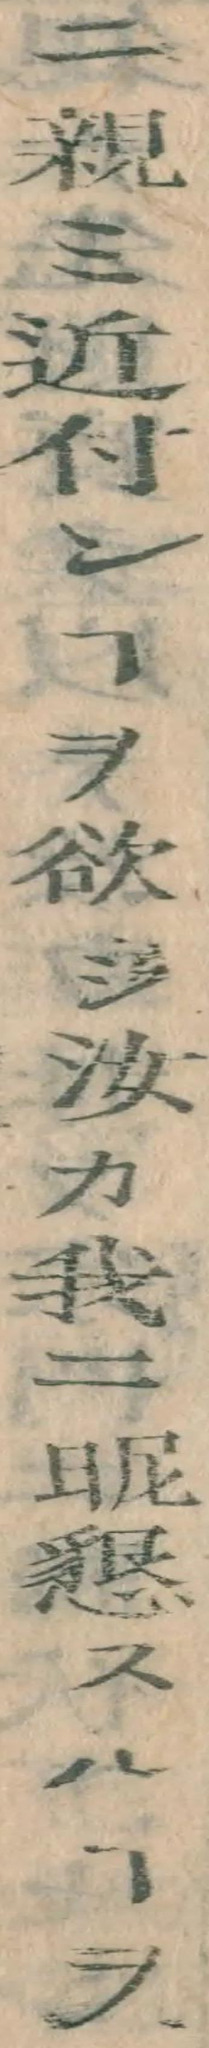ニ親ミ近付ンヿヲ欲シ汝カ我ニ昵懇スルヿヲ

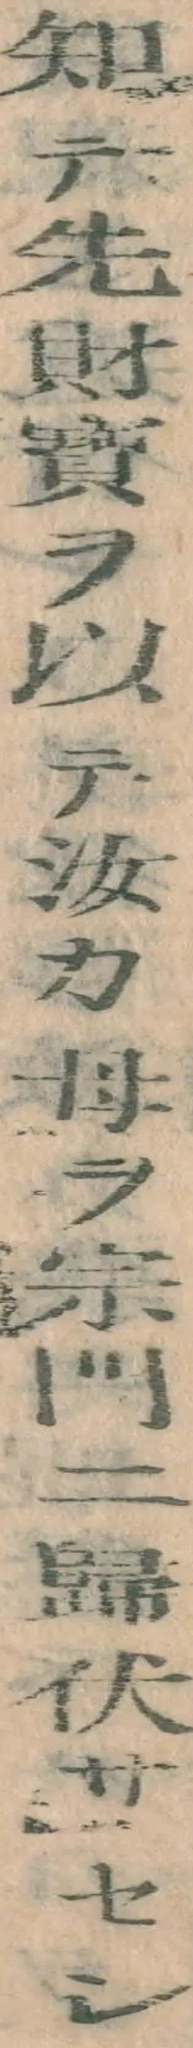知テ先財宝ヲ以テ汝カ母ヲ宗門ニ帰伏サセシ
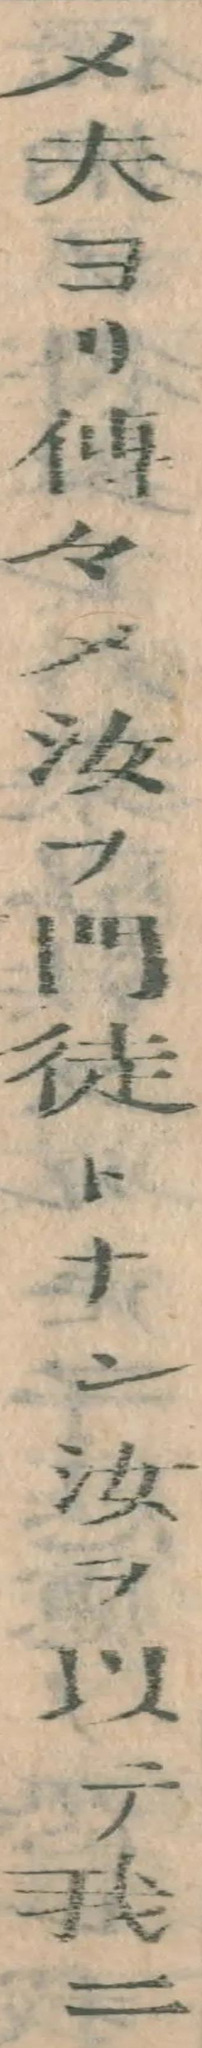メ夫ヨリ伝々シテ汝ヲ門徒トナシ汝ヲ以テ我ニ
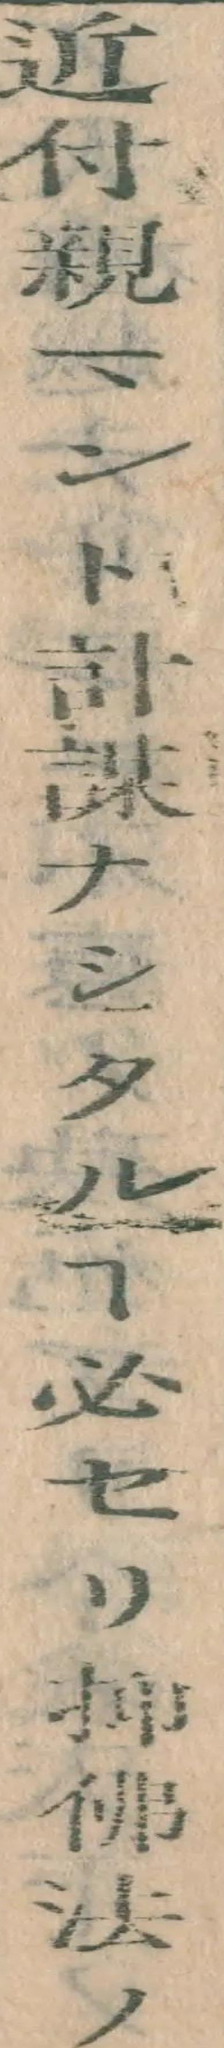近付親マント計謀ナシタルヿ必セリ抑仏法ノ
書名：南蛮寺興廃記
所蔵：国立国会図書館 National Diet Library, JAPAN
